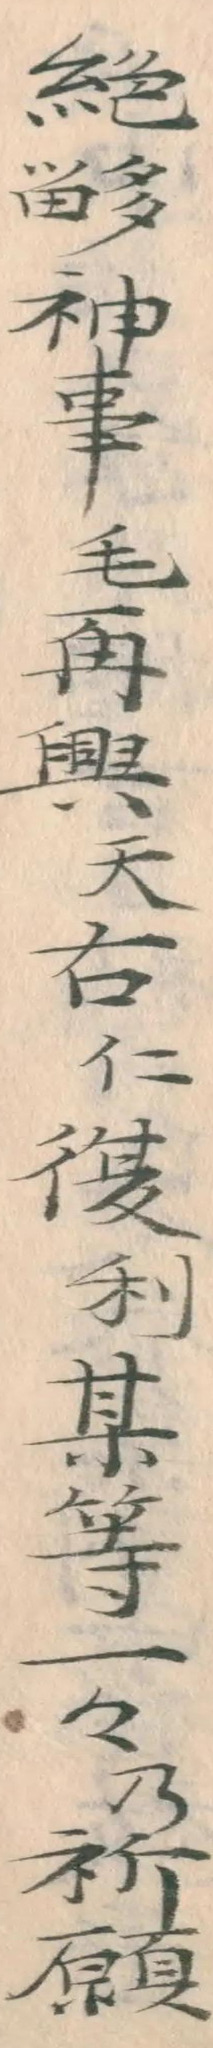絶神事毛再興天古仁復利某等一々乃祈願
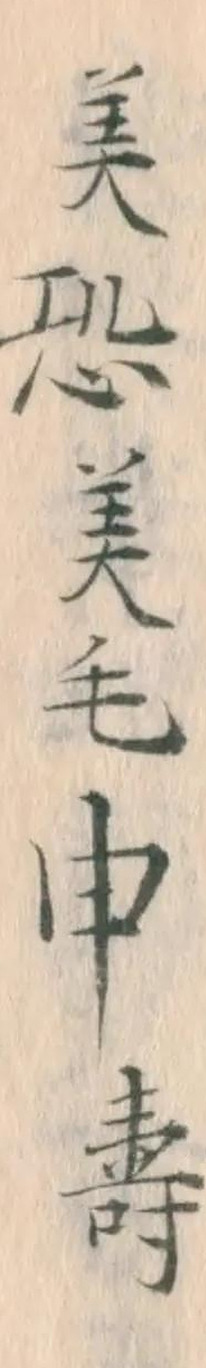美恐美毛申壽
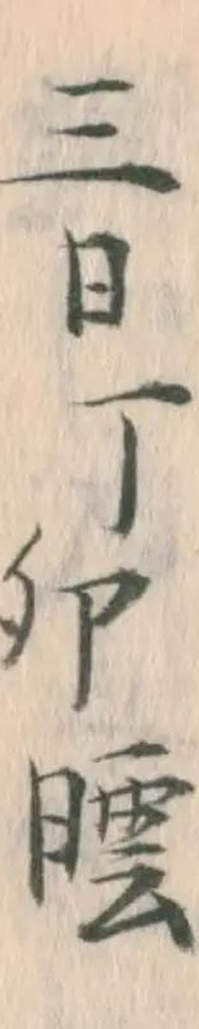三日丁卯曇
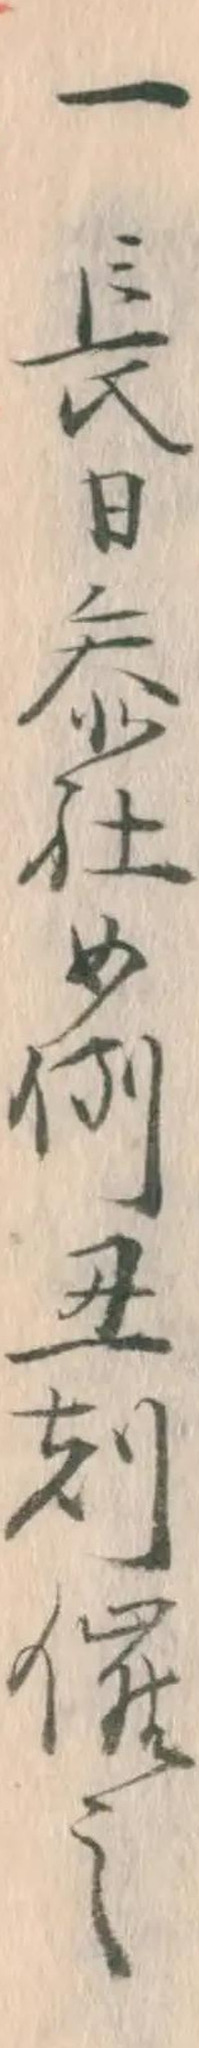一長日参社如例丑刻催之
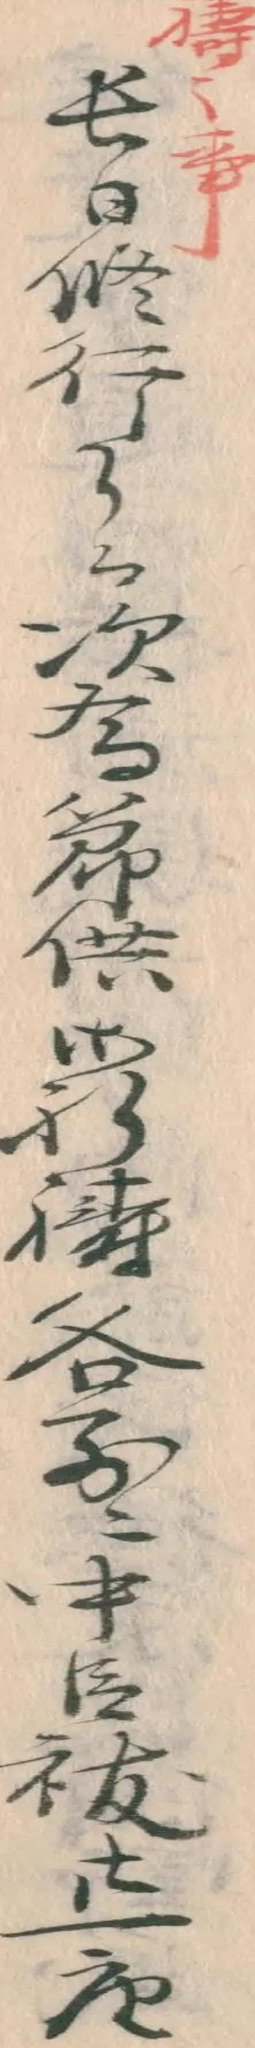一長日修行了而次為節供御祈祷各別ニ中臣祓廿一座
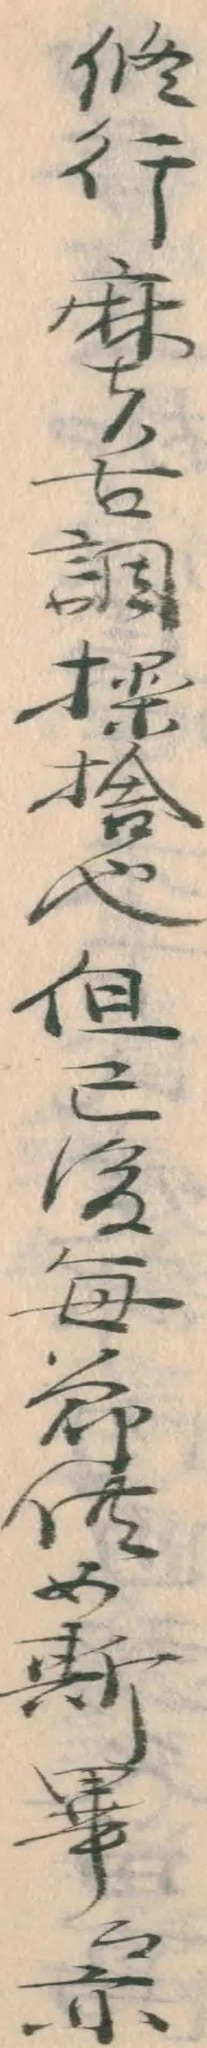修行麻者古調操捨也但已後毎節供如斯畢而亦
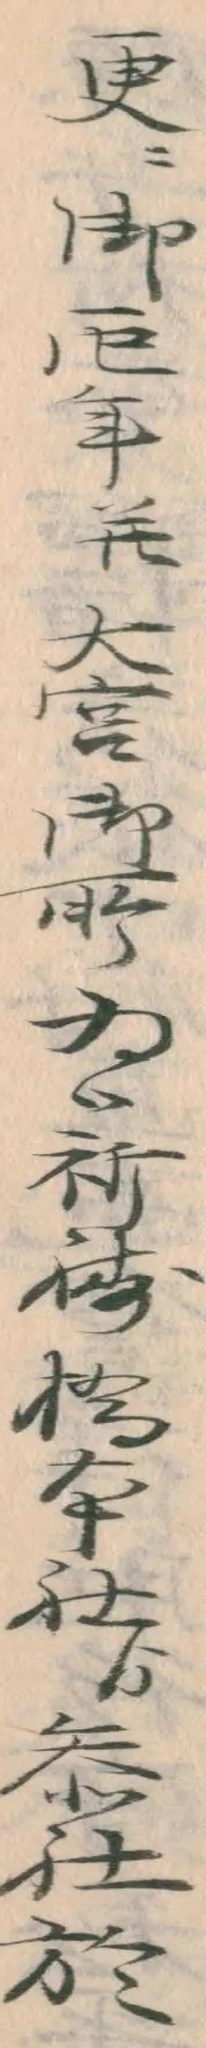更ニ御厄年并大宮御所為御祈祷橋本社ゟ参社於
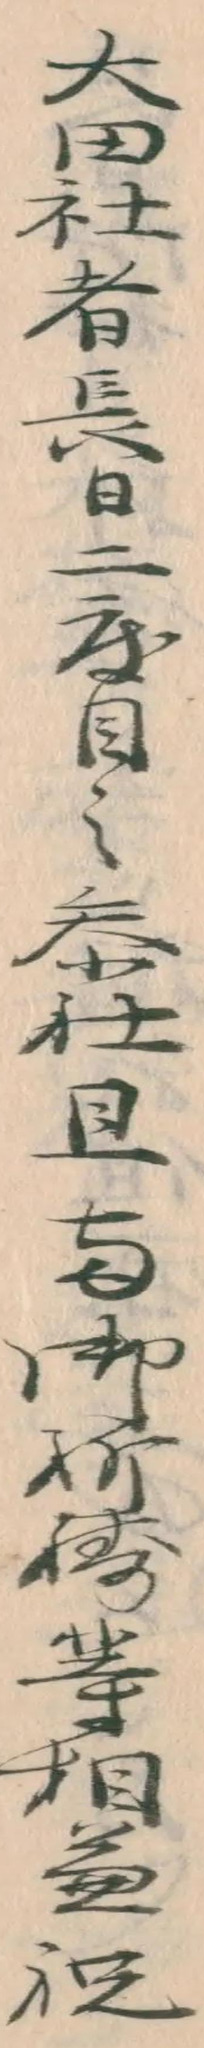大田社者長日二度目之参社且両御祈祷等相兼祝
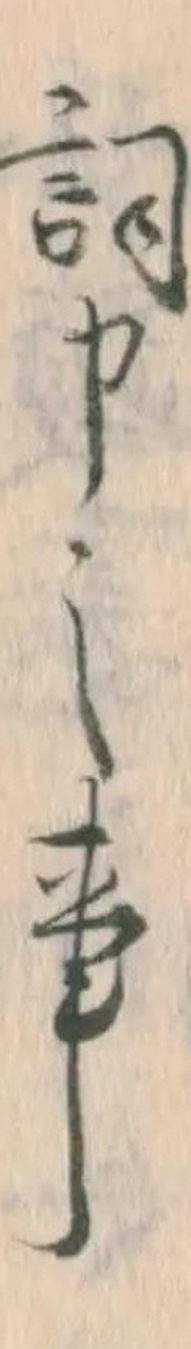詞申之事
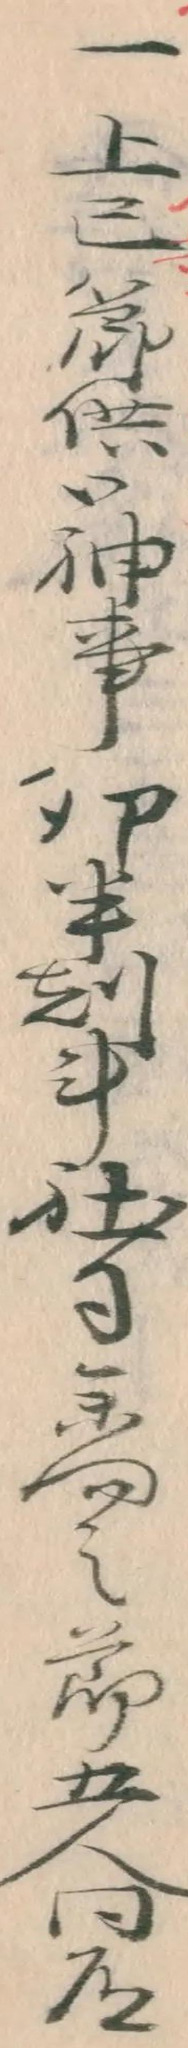一上巳節供御神事卯半刻斗社司参向之節五人同道
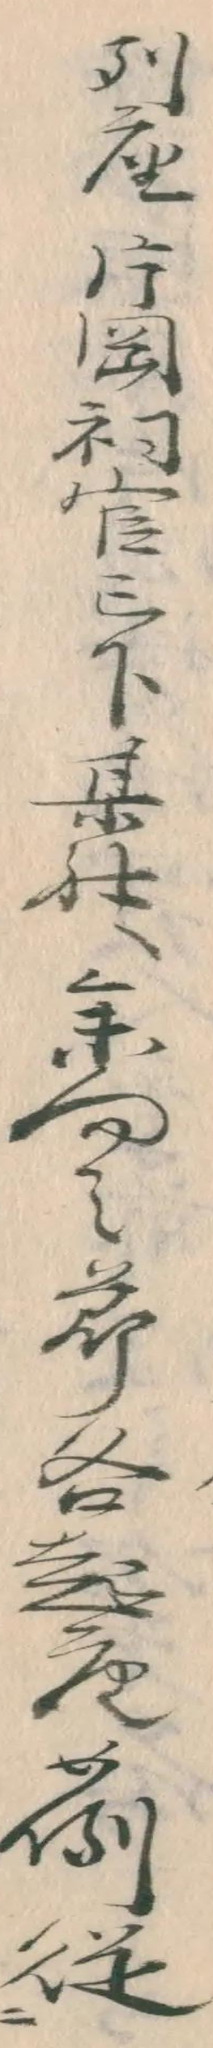列座片岡祠官已下某社へ参向之節各起座如例従
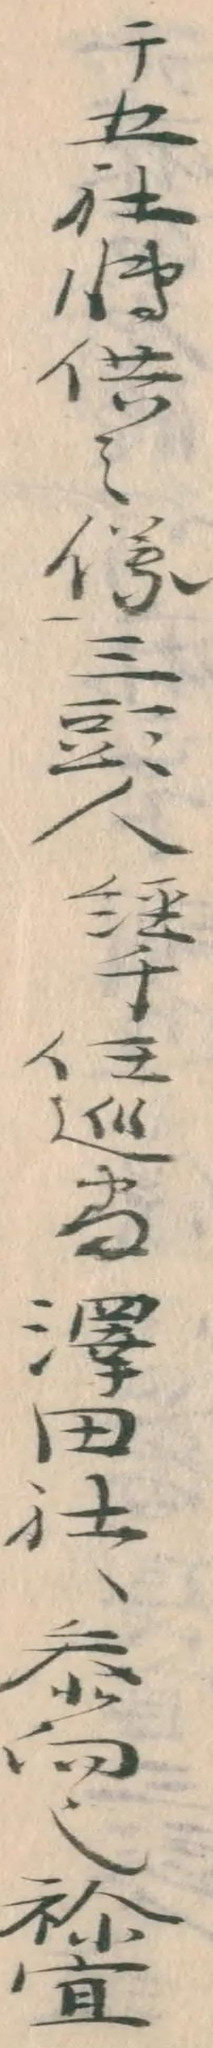于五社轉供之儀三頭人経千任巡番澤田社へ参向也祢宜
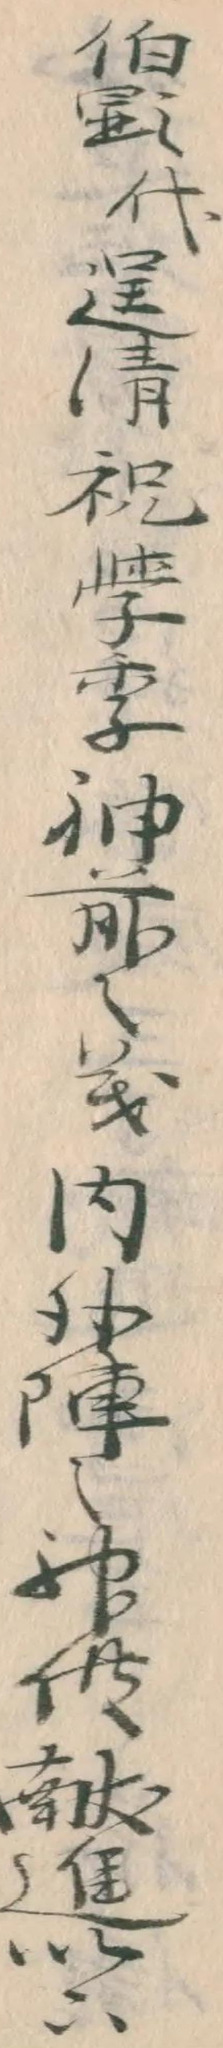伯顕代逞清祝學季神前之義内外陣之神供献進以下
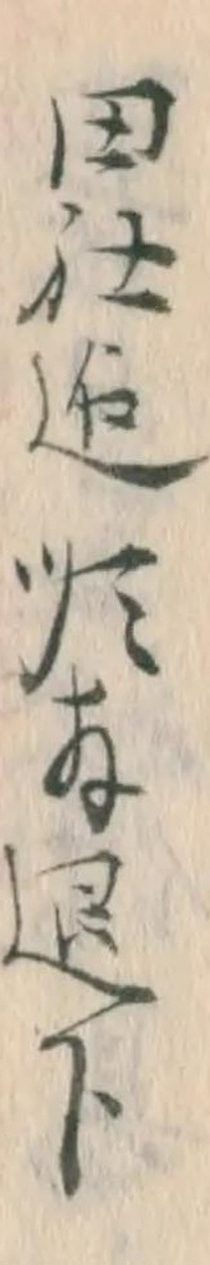田社迄順拝退下
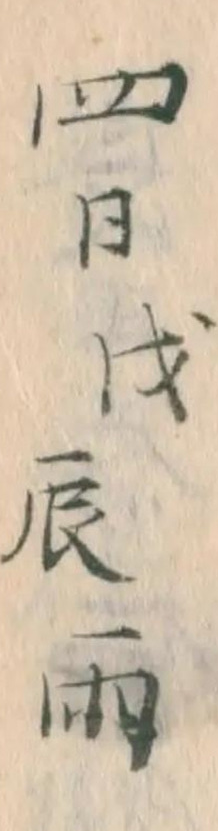四日戊辰雨

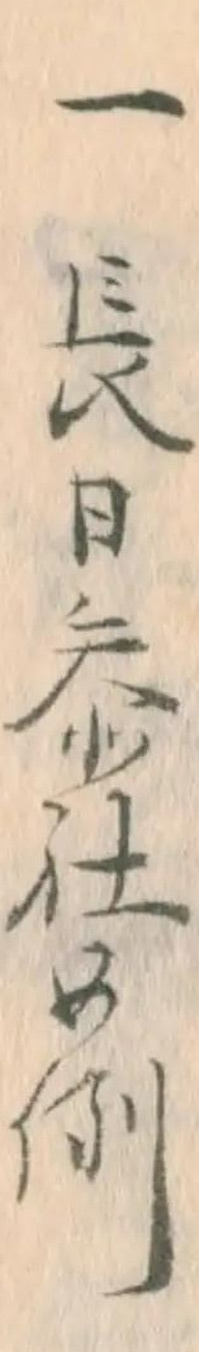一長日参社如例
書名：賀茂社記録. 第73冊
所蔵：国立国会図書館 National Diet Library, JAPAN
